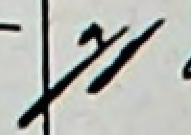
71
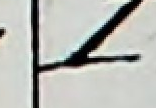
I
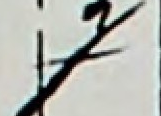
7
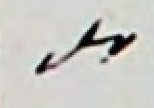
do
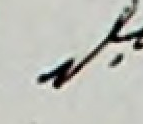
do
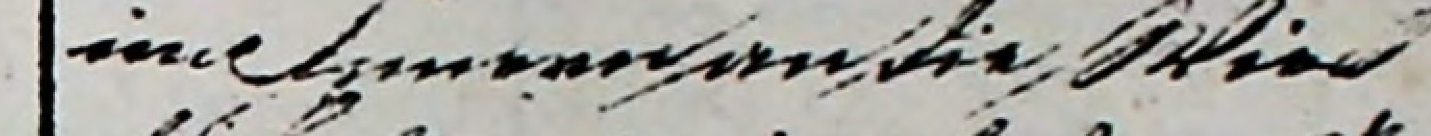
im ???ern an die Wir?
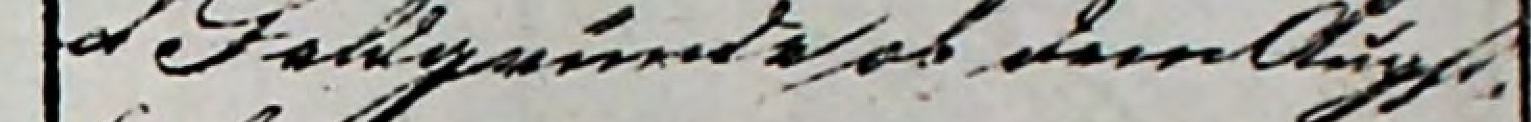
& Soldgründe ob dem Augst.
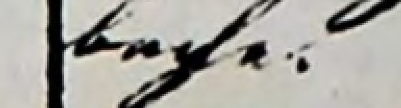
bache.
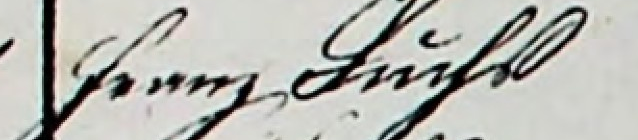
Franz Suchs
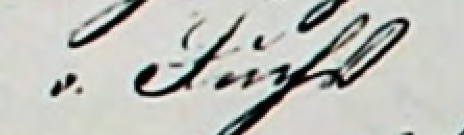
v. Suchs
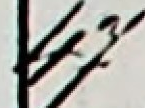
47
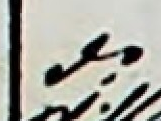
do
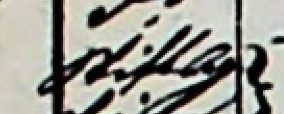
Stiftsg.
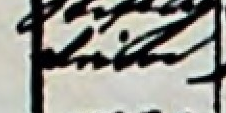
Rain
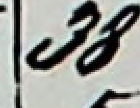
38
